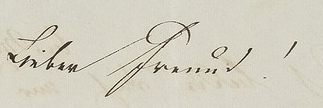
Lieber Freund!
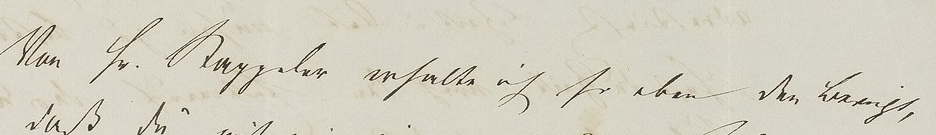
Von Hr. Kappeler erhalte ich so eben den Bericht,
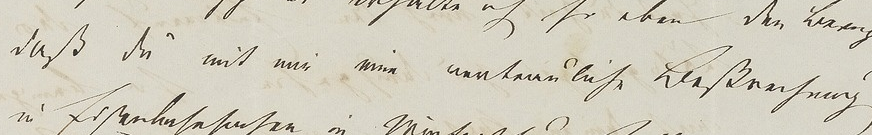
daß du mit mir eine vertrauliche Besprechung
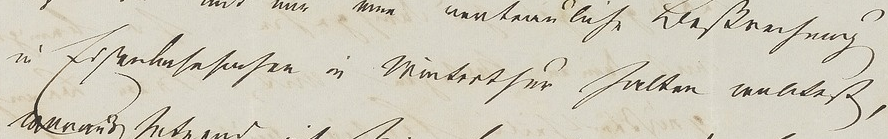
in Eisenbahnsachen in Winterthur halten wolltest,
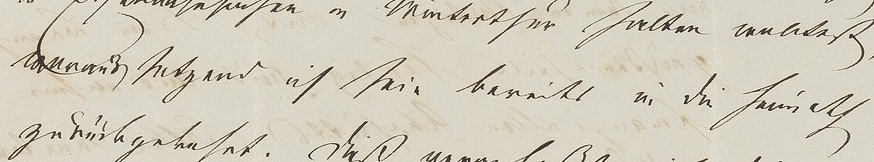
voraussetzend ich seie bereits in die Heimath
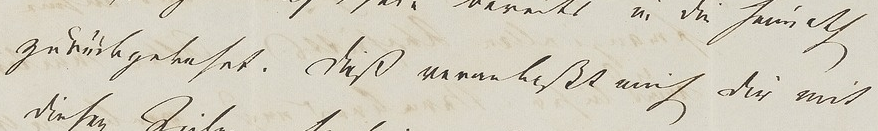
zurückgekehrt. Dieß veranlaßt mich Dir mit
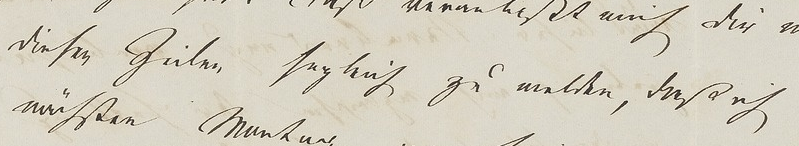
diesen Zeilen sogleich zu melden, daß ich
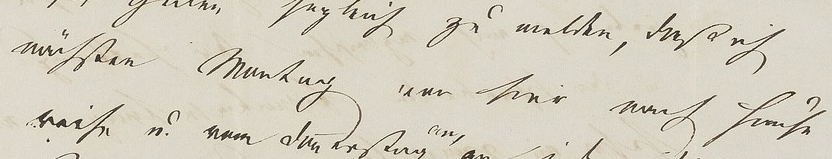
nächsten Montag von hier nach Hause
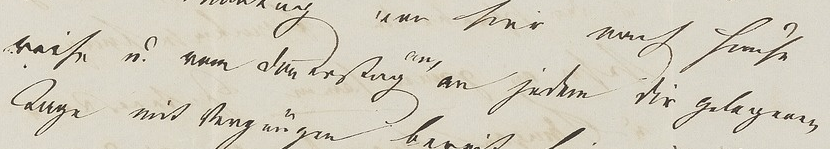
reise u. vom Donnerstagan, an jedem Dir gelegenen
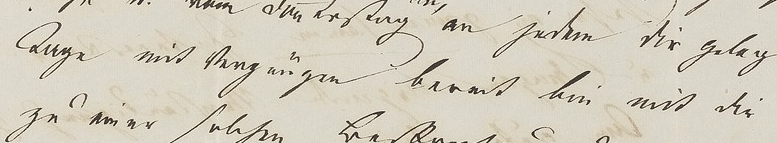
Tage mit Vergnügen bereit bin mit Dir
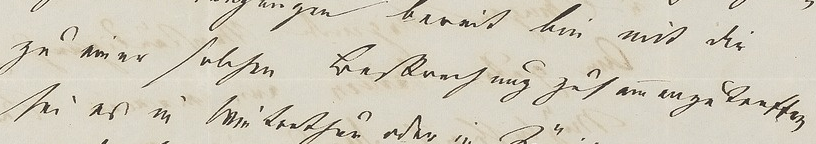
zu einer solchen Besprechung zusammenzutreffen
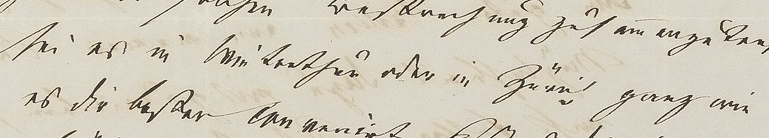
sei es in Winterthur oder in Zürich ganz wie
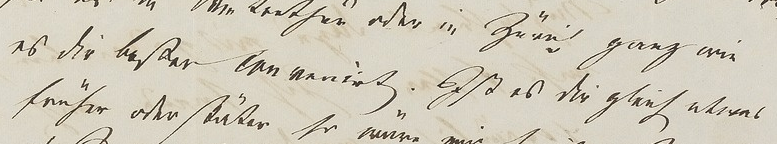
es dir besser convenirt. Ist es Dir gleich etwas
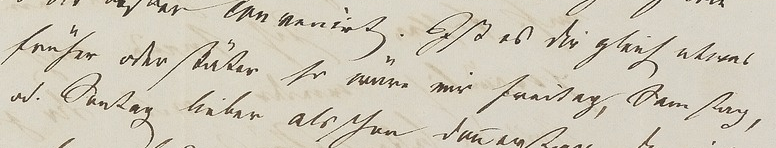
früher oder später so wäre mir Freitag, Samstag,
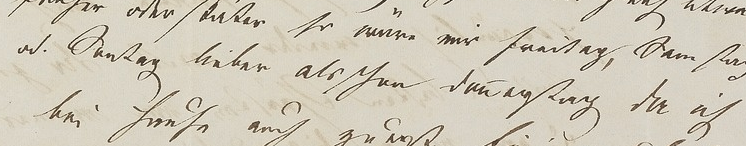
od. Sontag lieber als schon Donnerstag da ich
